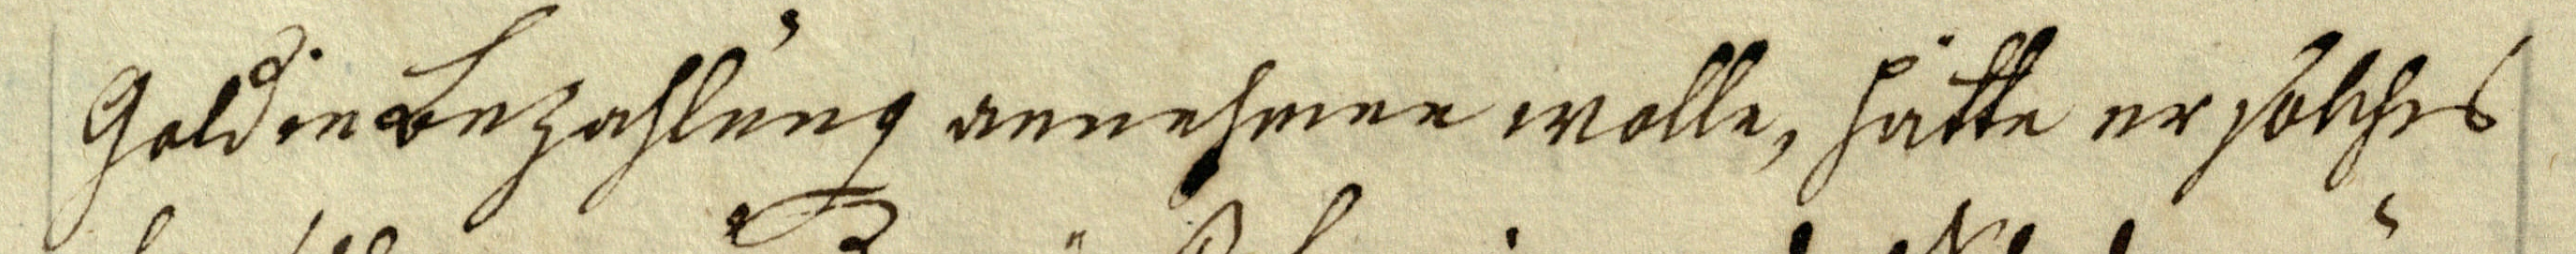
Gold in Bezahlung annehmen wolle, hätte er solches
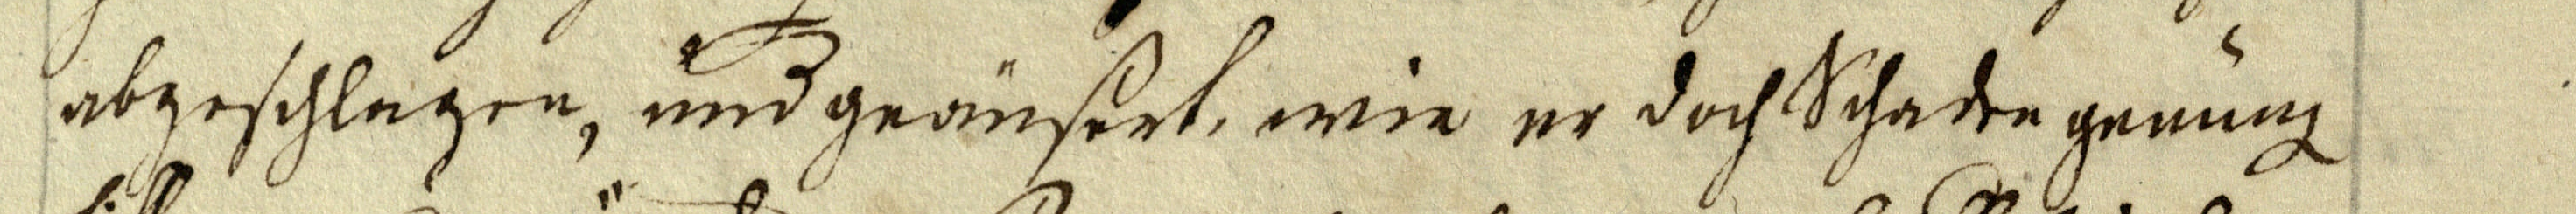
abgeschlagen, und geäußert, wie er doch Schaden genug
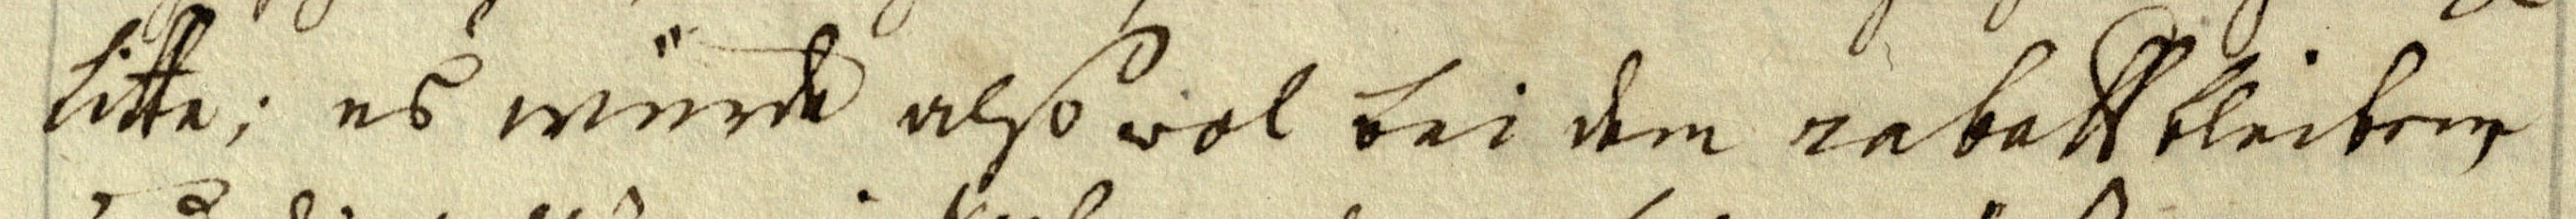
litte, es würde also wol bei dem rabatt bleiben
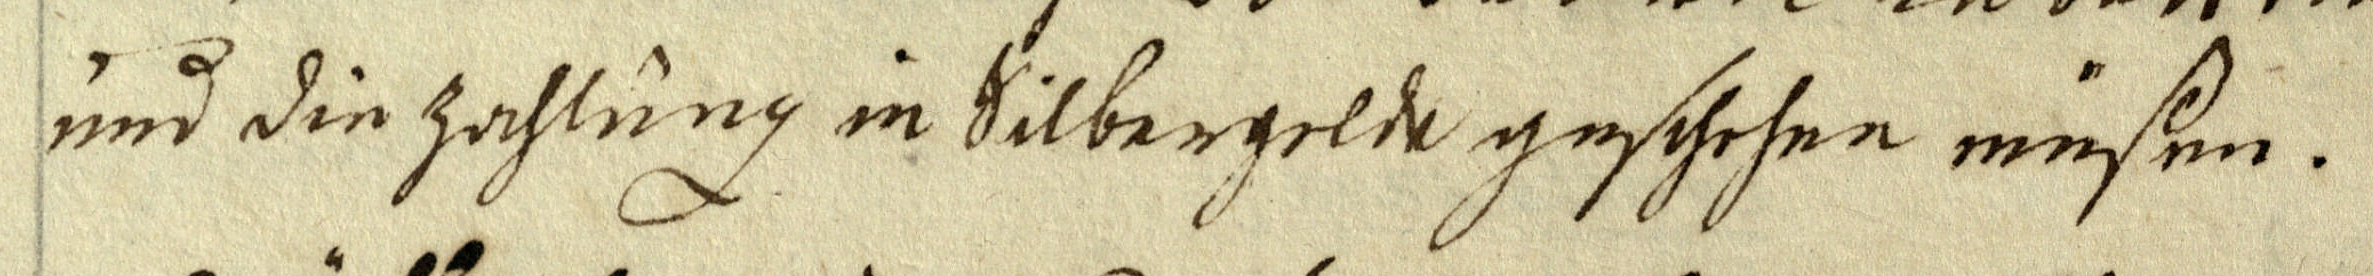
und die zahlung in Silbergelde geschehen müßen.
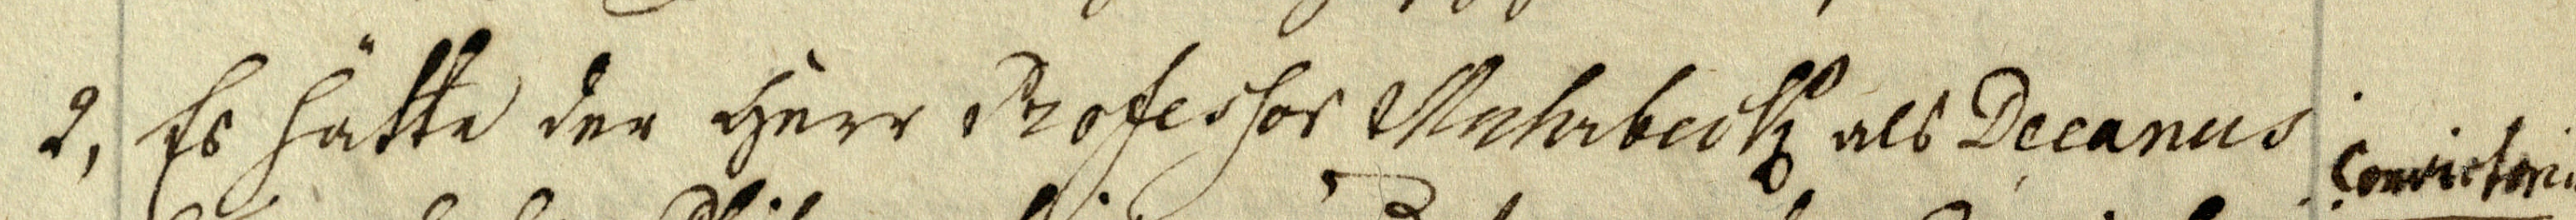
2, Es hätte der Herr Professor Muhrbeck als Decanus
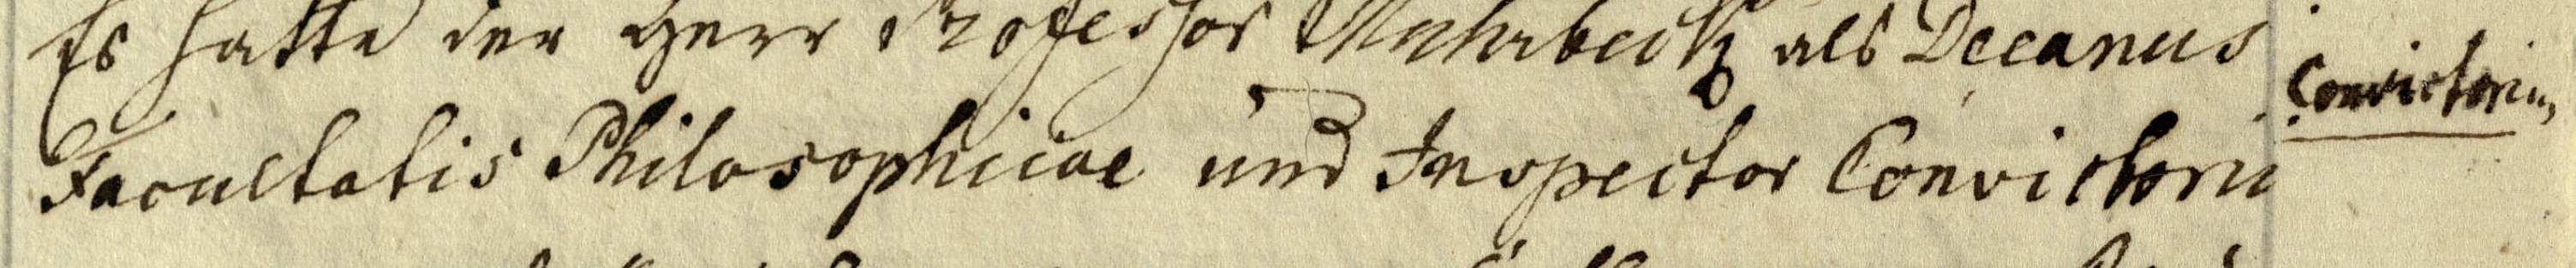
Facultatis Philosophicae und Inspector Convictorii Convictorii
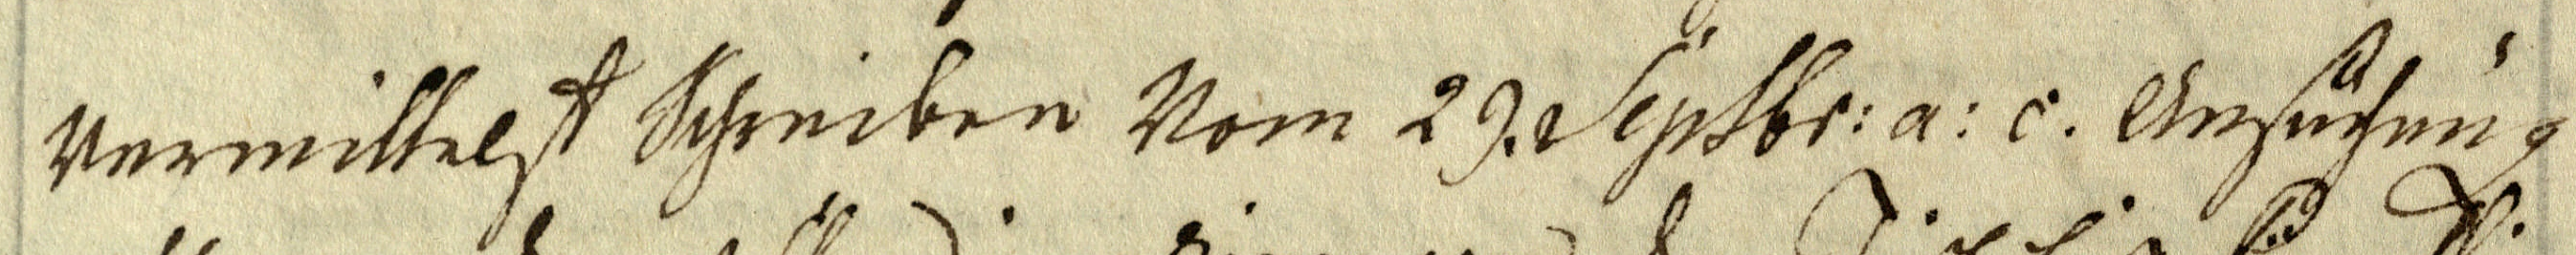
vermittelst Schreiben vom 29. Septbr: a: c: Ansuchung
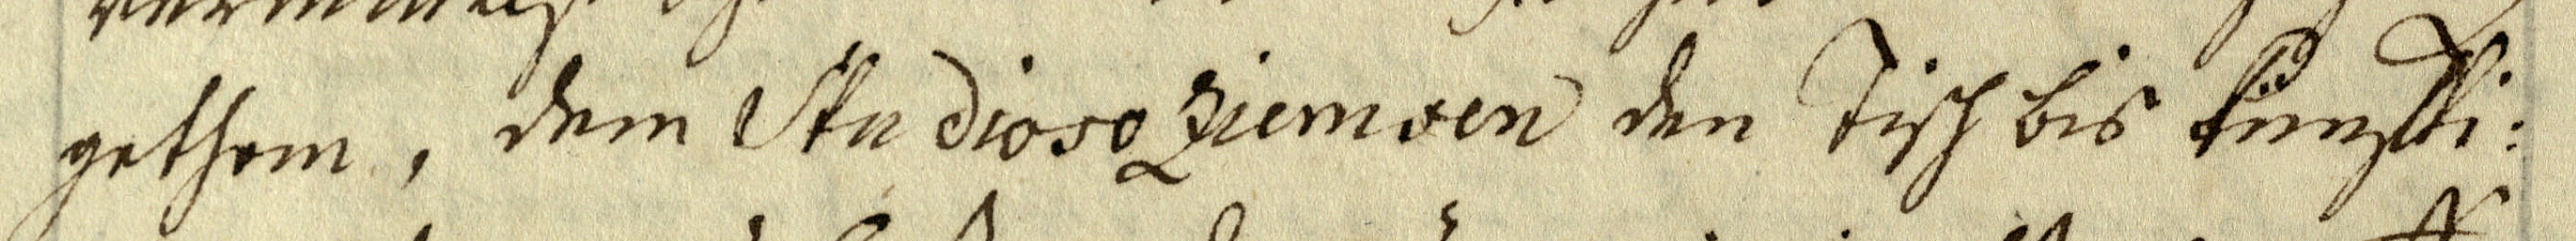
gethan, dem Studioso Ziemsen den Tisch bis künfti¬
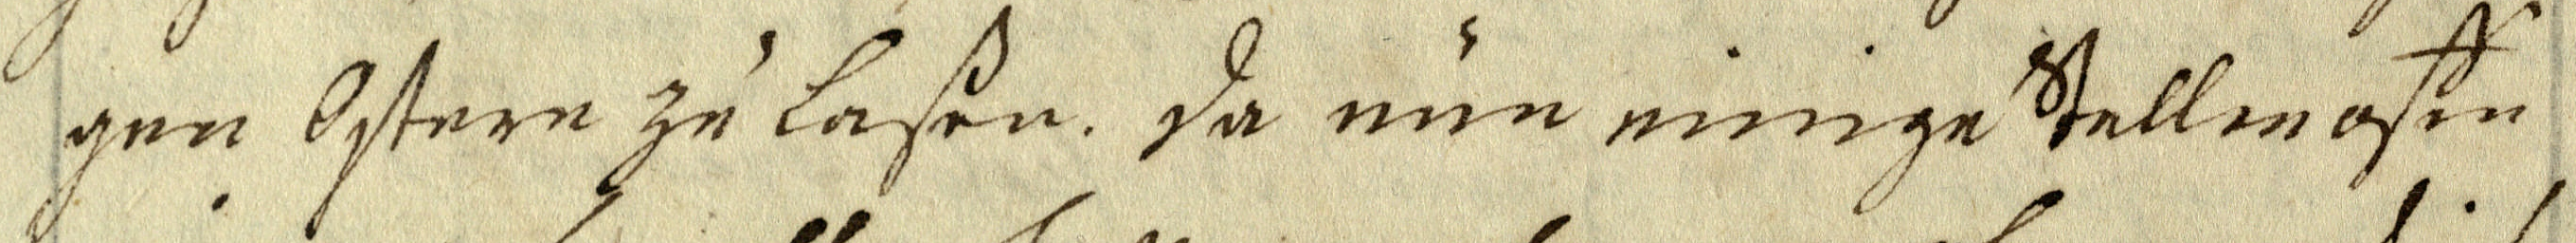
gen Ostern zu laßen. Da nun einige Stellen offen
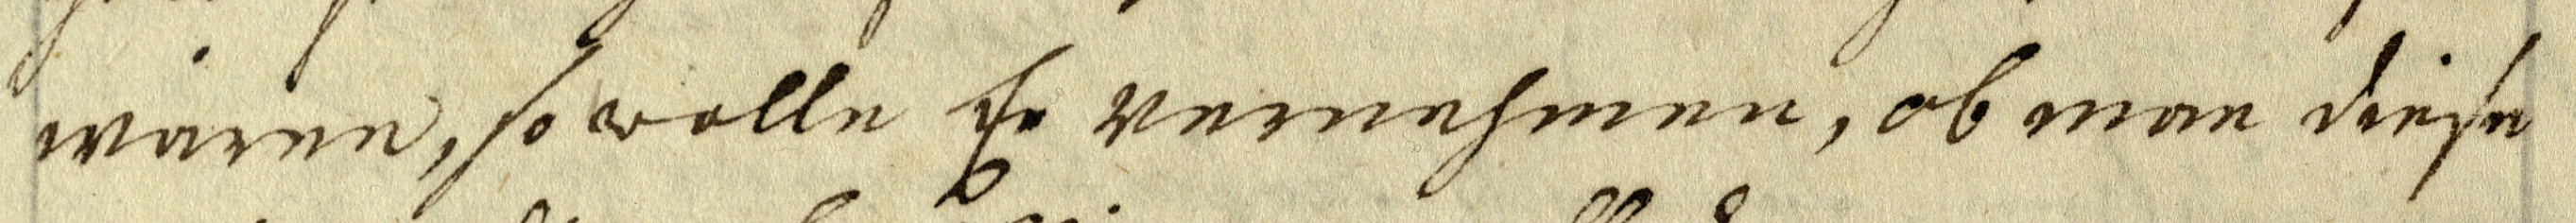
wären, so wolle Er vernehmen, ob man diese
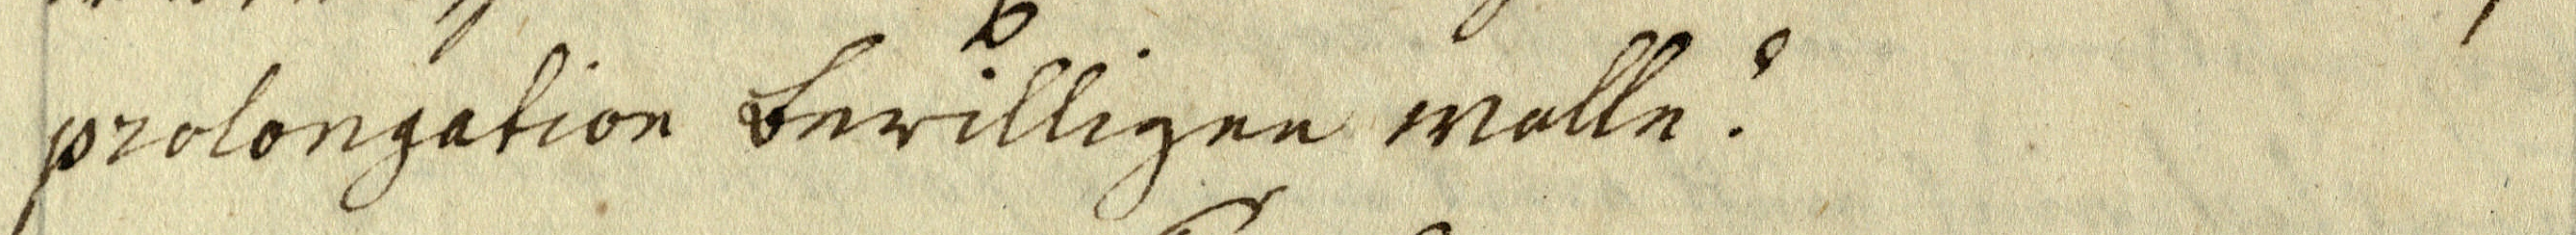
prolongation bewilligen wolle!
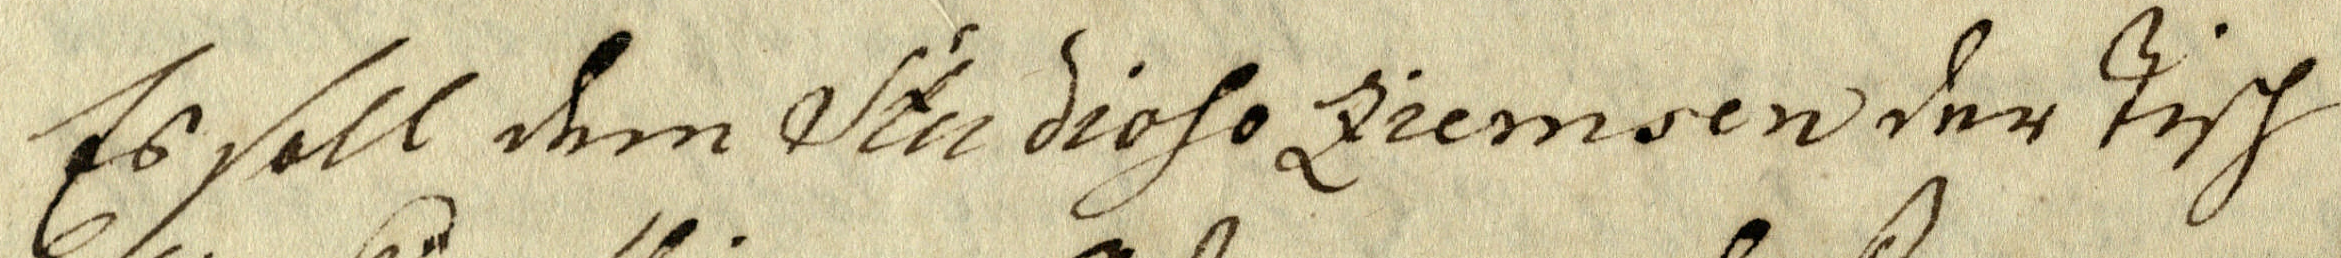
Es soll dem Studioso Ziemsen der Tisch
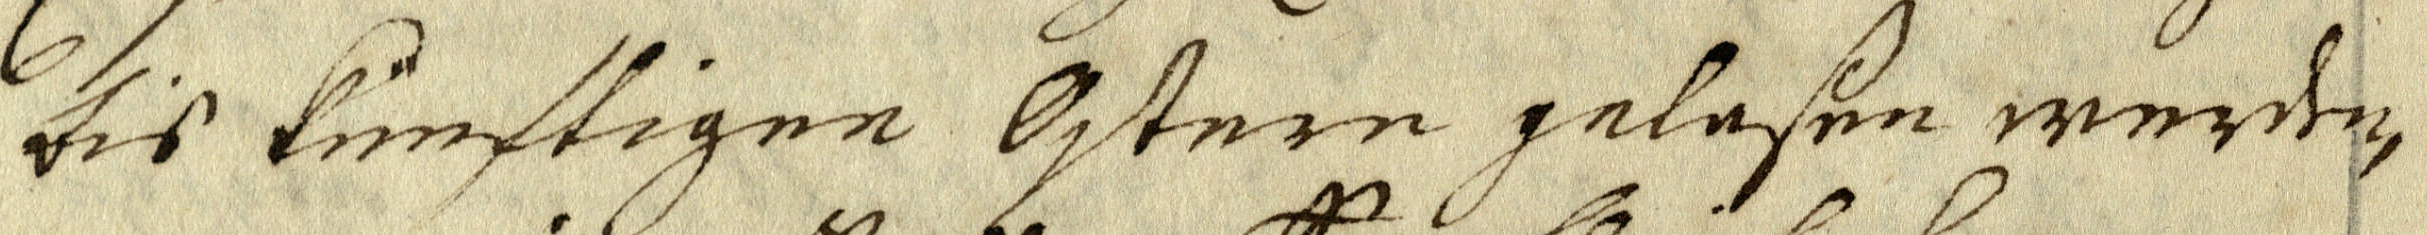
bis künftigen Ostern gelaßen werden,
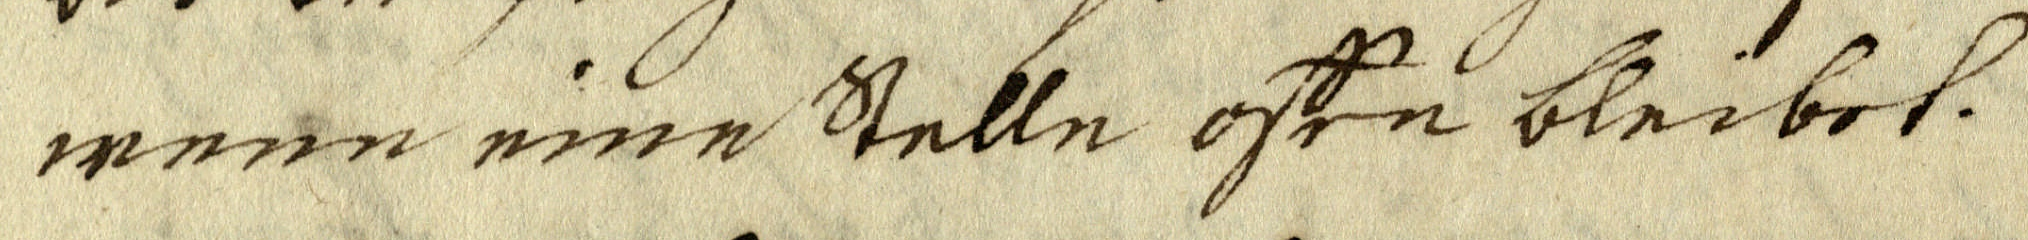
wenn eine Stelle offen bleibet.
